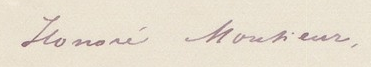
Honoré Monsieur,
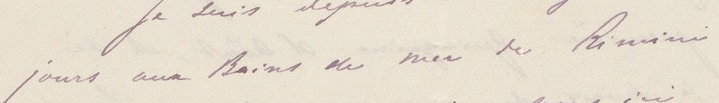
jours aux Bains de mer de Rimini
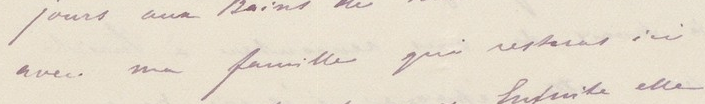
avec ma famille qui resteras ici
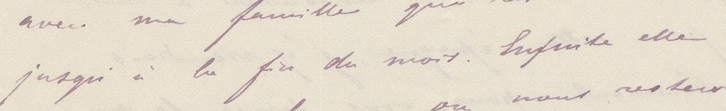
jusqu'à la fin du mois. Ensuite elle
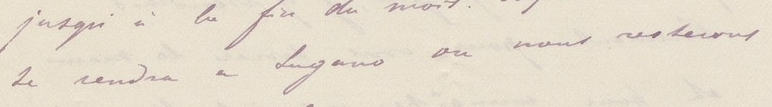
se rendra a Lugano ou nous resterons
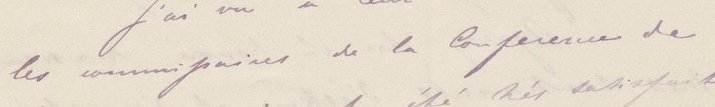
les commissaires de la Conference de
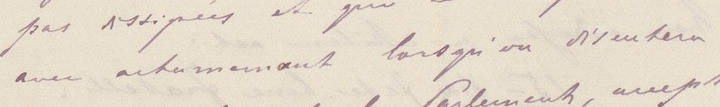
avec acharnemant lorsqu'on discutera
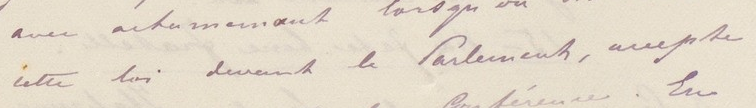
cette loi devant le Parlement, accepte
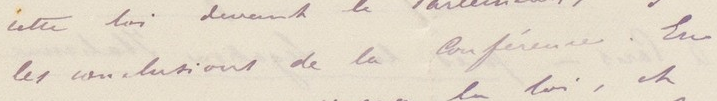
les conclusions de la Conférence. En
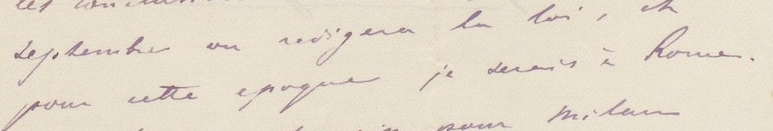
pour cette epoque je servais à Rome.
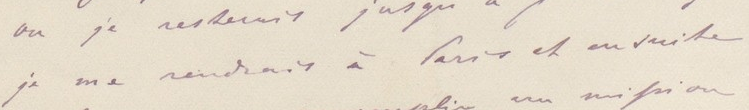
je me rendrais à Paris et ensuite
